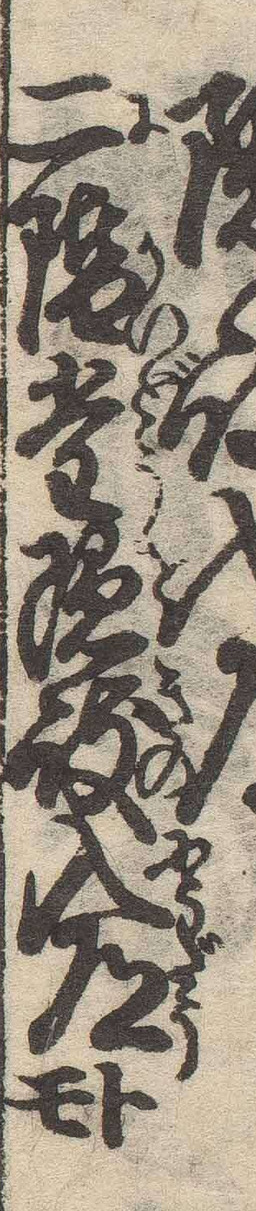二階堂隠岐入道トモ
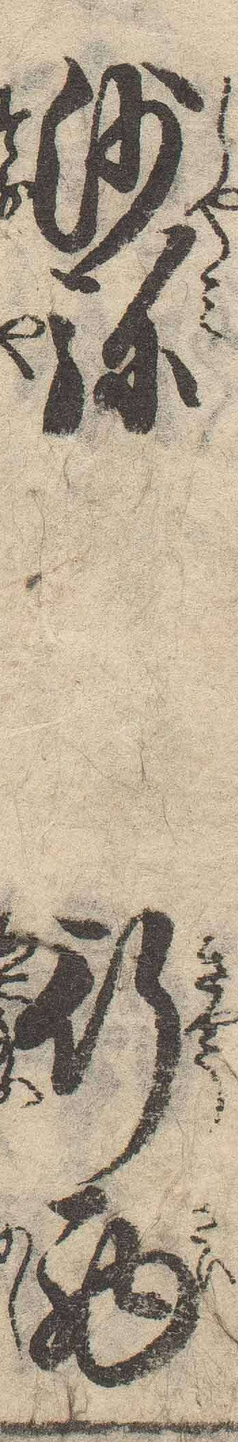沙弥行西
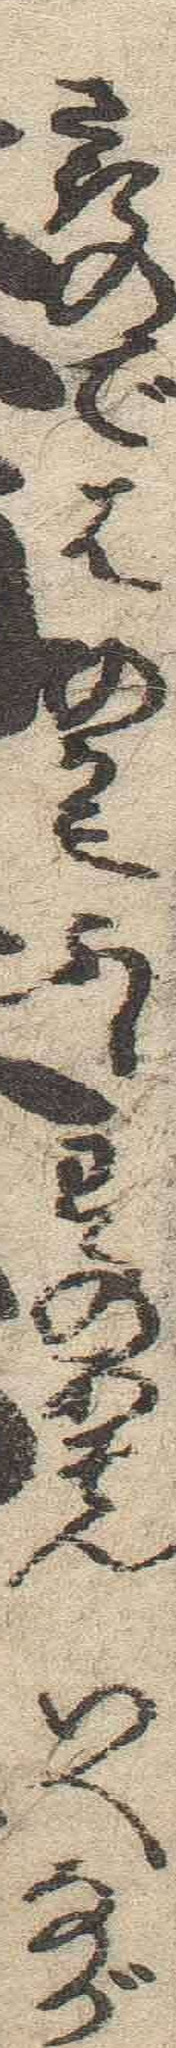さきのではのかみふしわらのあそんいへなが
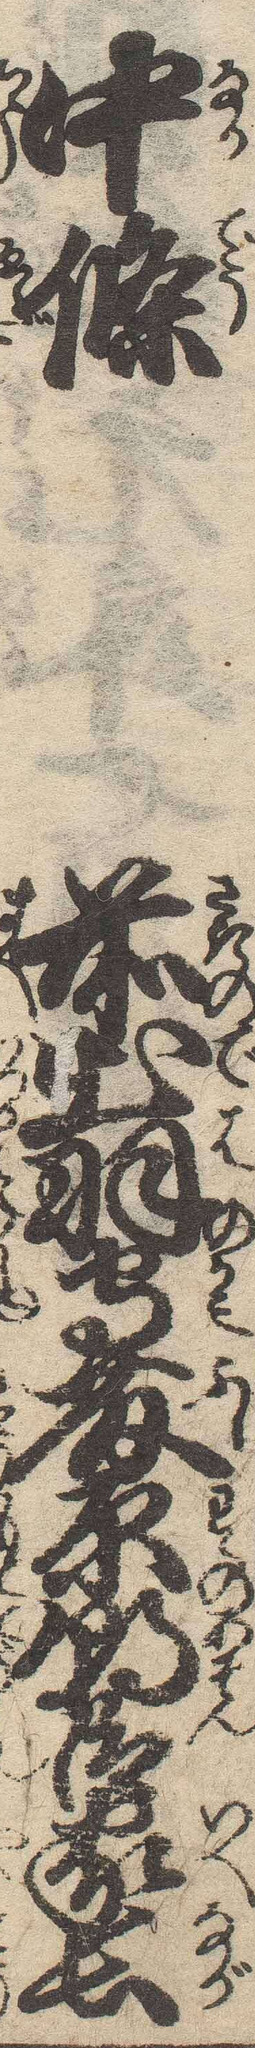前出羽守藤原朝臣家長
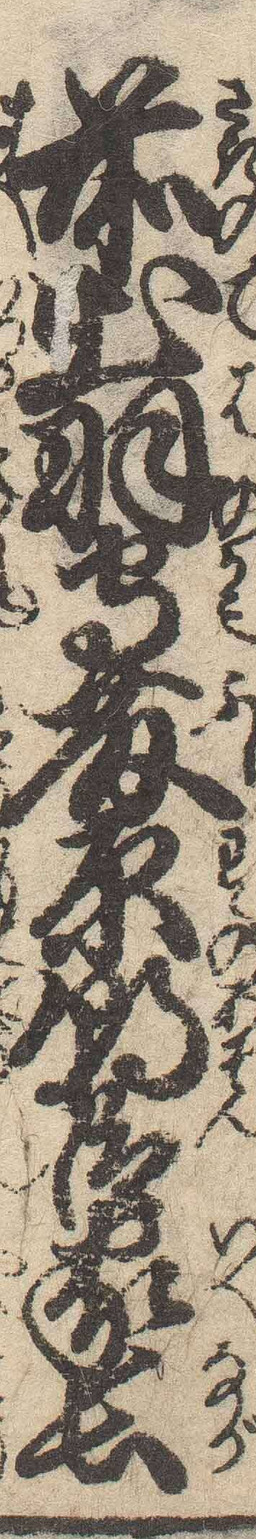前出羽守藤原朝臣家長
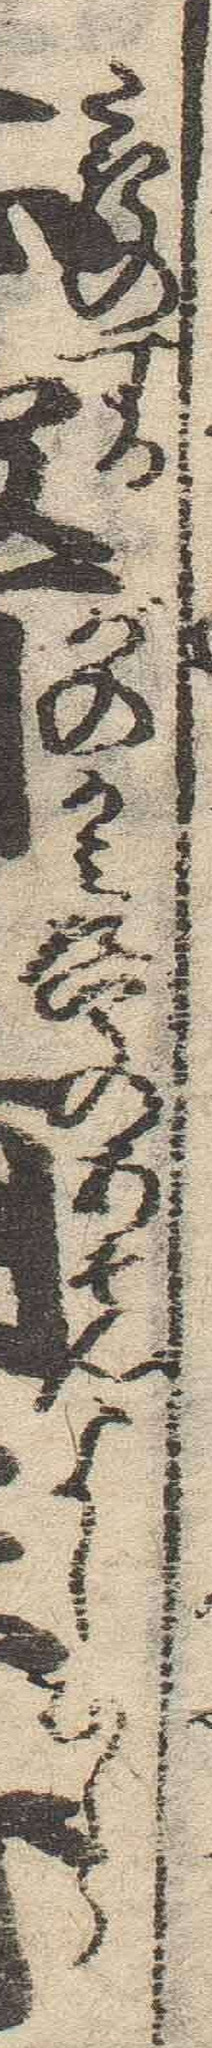さきのするがのかみたいらのあそんよしむら
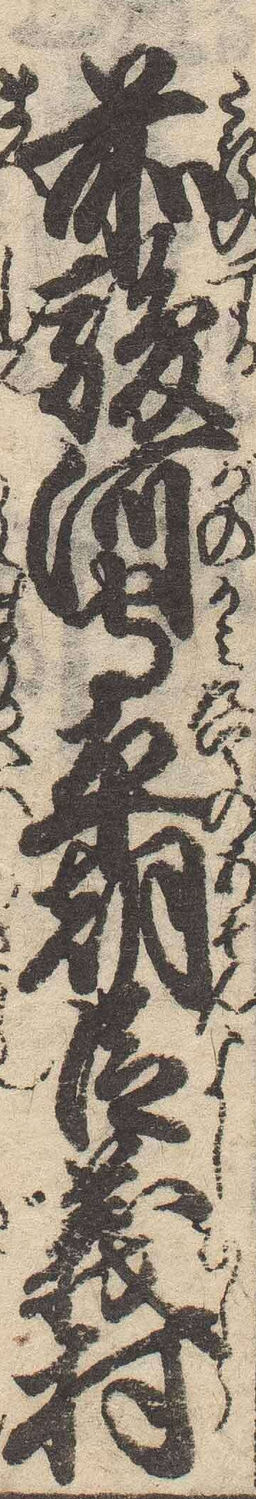前駿河守平朝臣義村
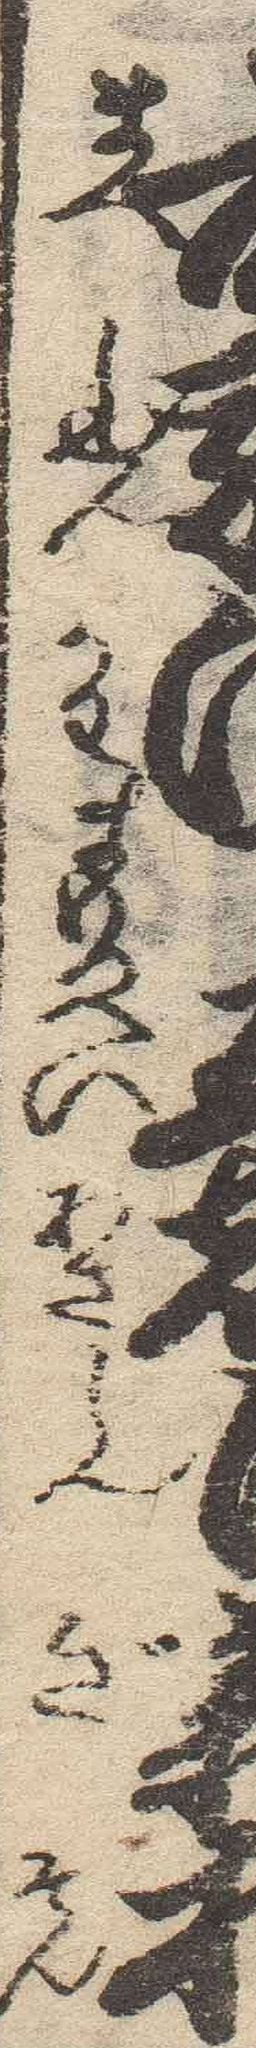まへしゆんかわまもるへいあさしんぎそん
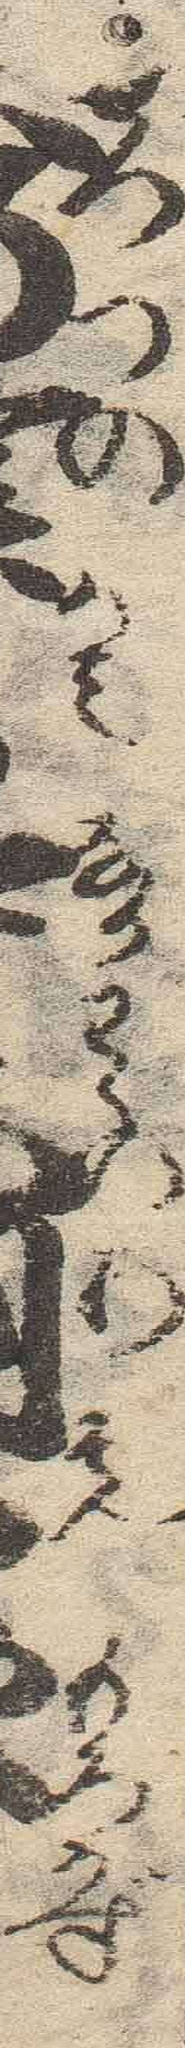せつつのかみなかわらのあそんもろかず
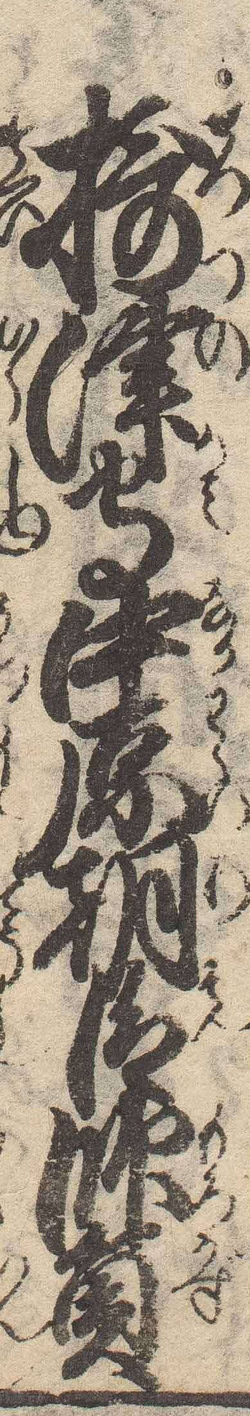摂津守中原朝臣師員
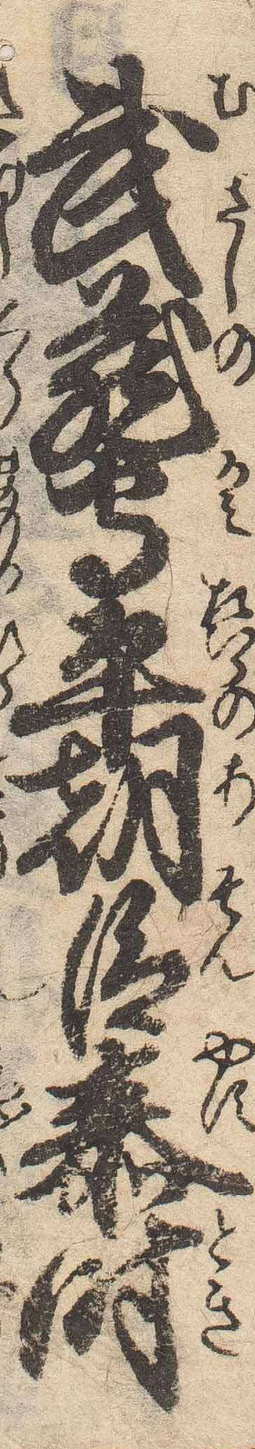武蔵守平朝臣泰時
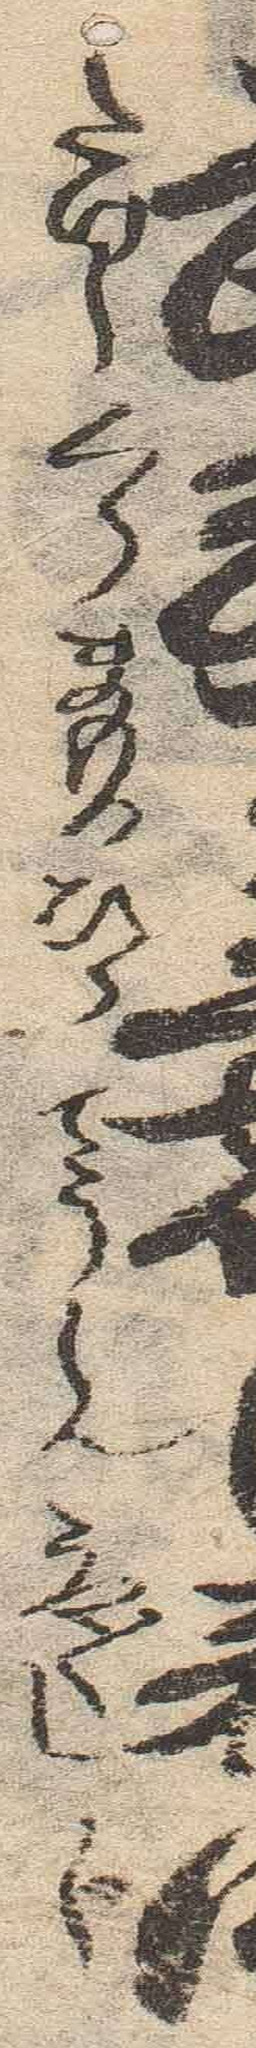たけしくらまもるひらてうしんうや〳〵しじ
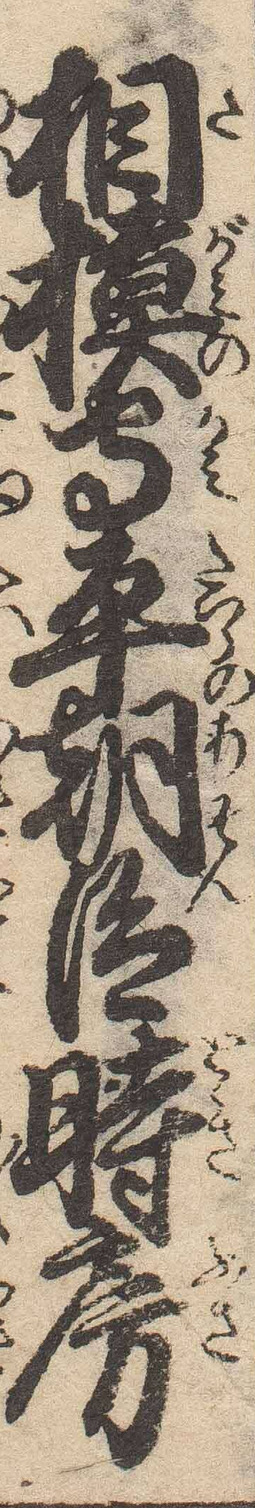相模守平朝臣時房
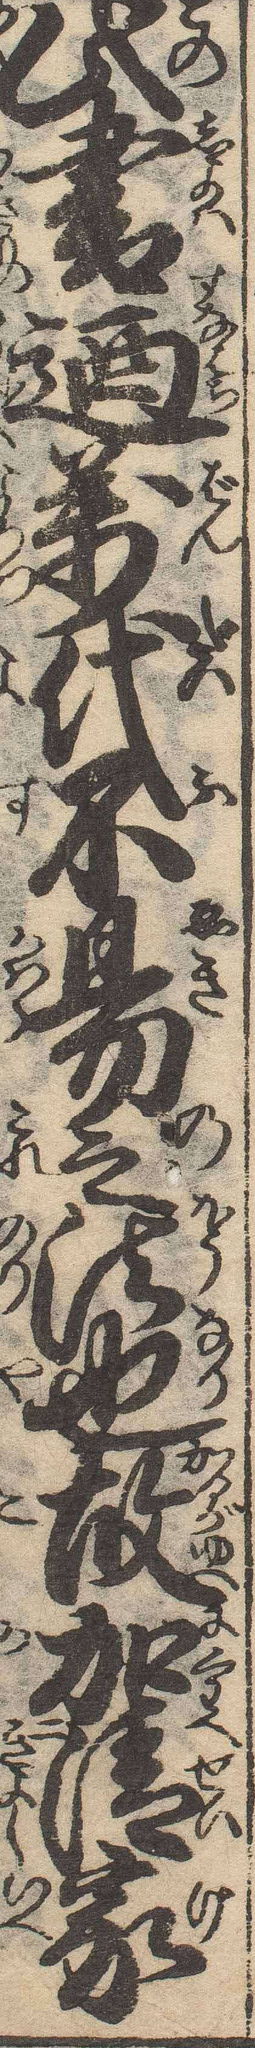此書迺萬代不易之法也故加清家
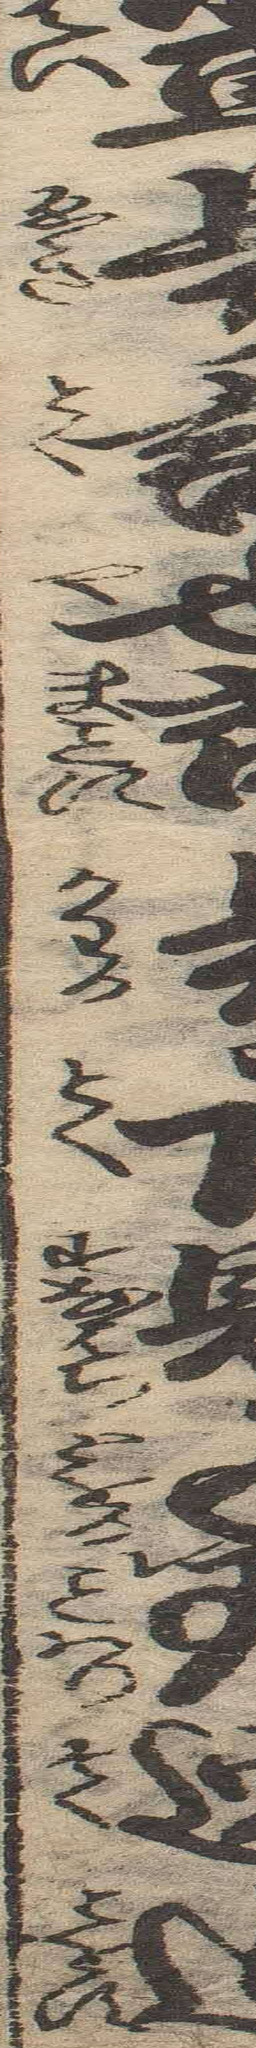はいゑきとくやまことにかわるとくすなはちとをることわりそくとをす
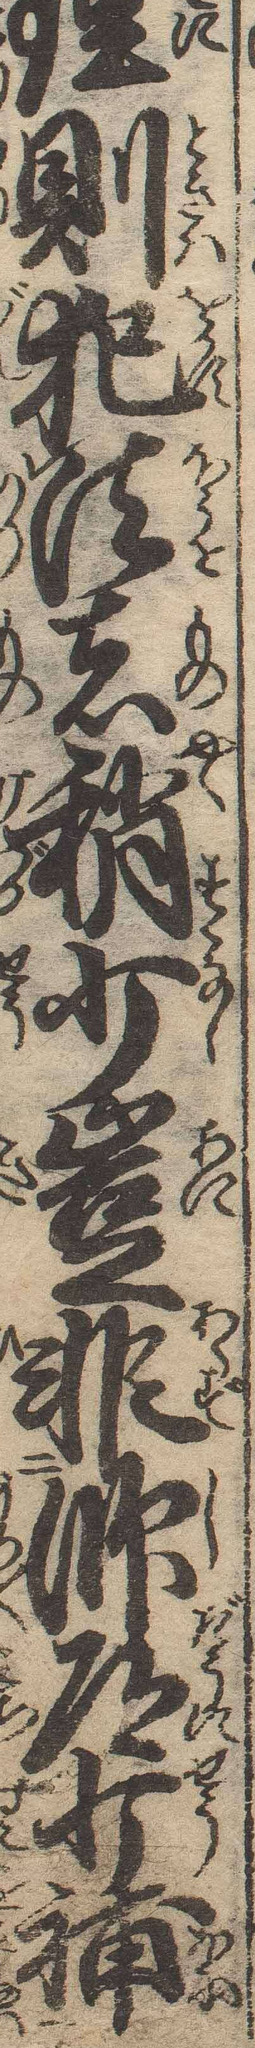理則犯法者稍少豈非師道少補
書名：御成敗式目絵抄
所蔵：東京学芸大学附属図書館 国文学研究資料館
